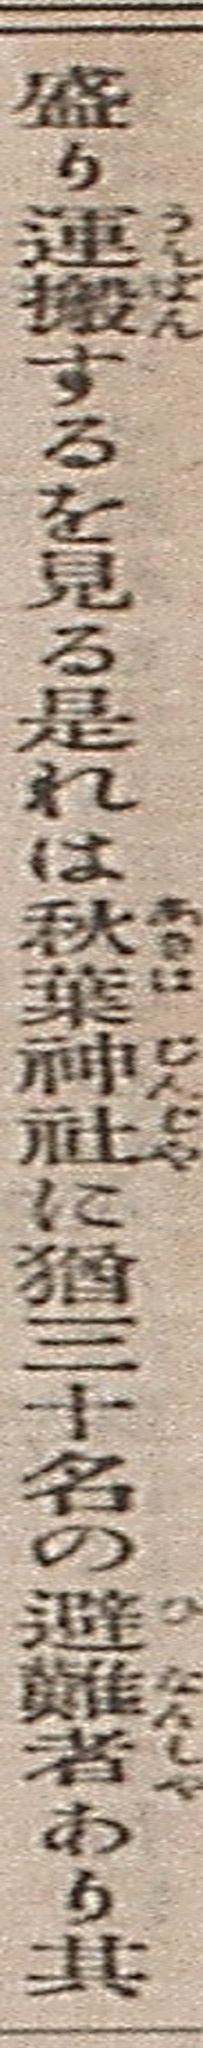盛り運搬するを見る是れは秋葉神社に猶三十名の避難者あり其
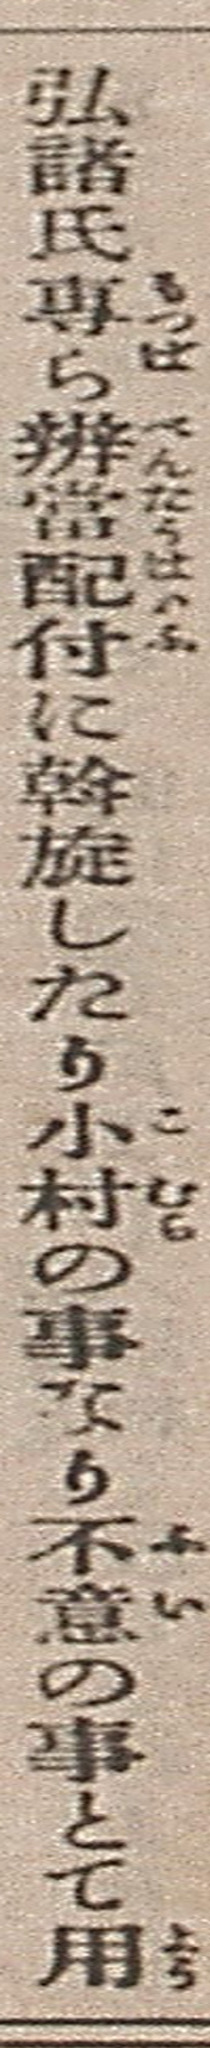弘諸氏専ら弁当配布に斡旋したり小村の事なり不意の事とて用
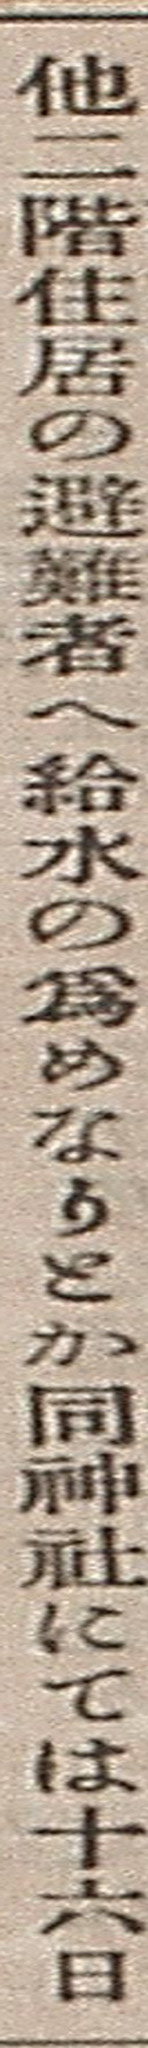他ニ階住居の避難者へ給水の為めなりとか同神社にては十六日
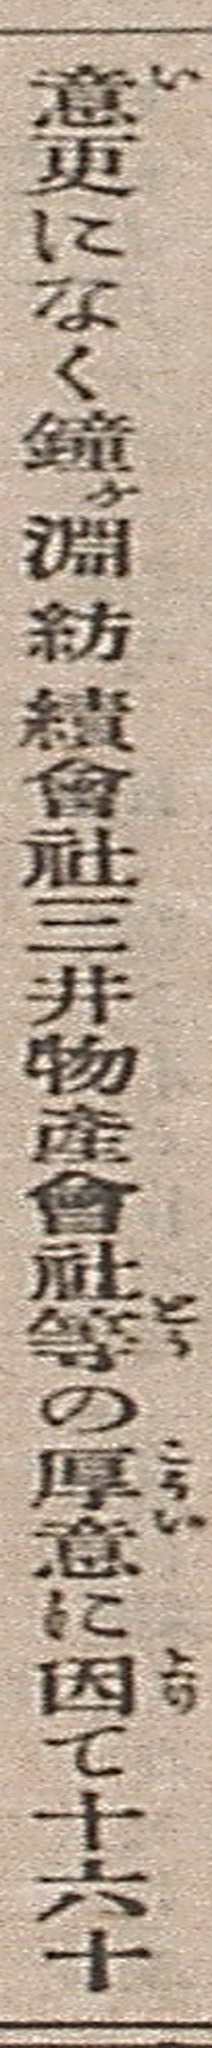意更になく鐘ケ淵紡績会社三井物産会社等の厚意に因て十六十
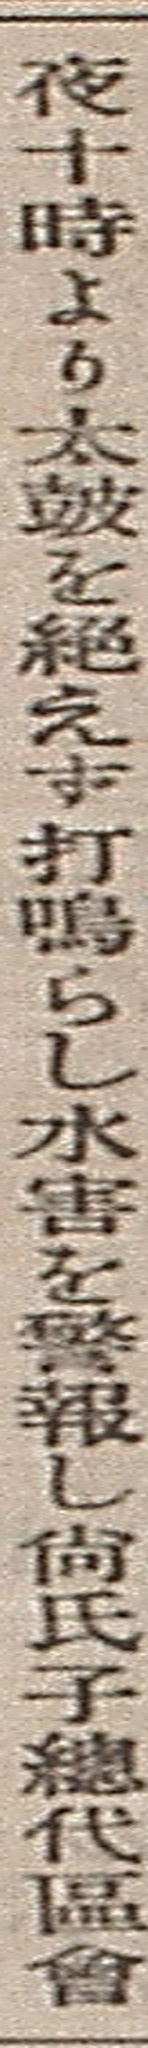夜十時より太鼓を絶えず打鳴らし水害を警報し尚氏子総代区会
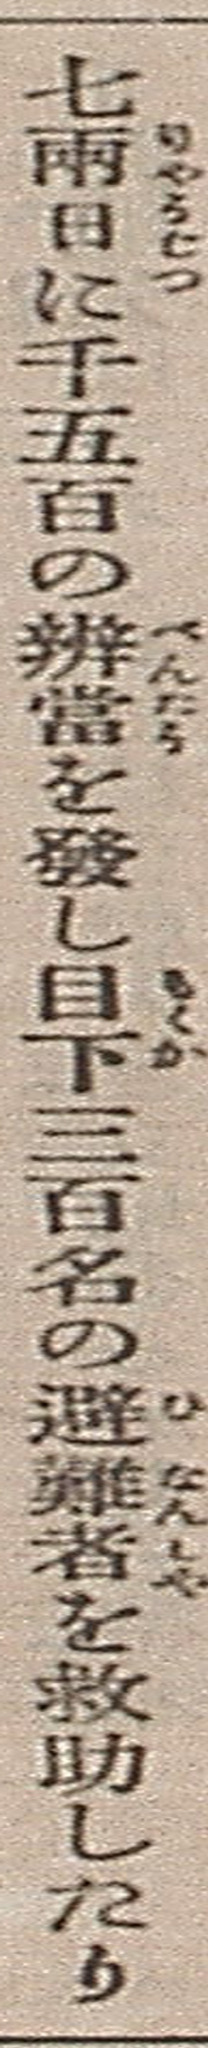七両日に千五百の弁当を発し目下三百名の避難者を救助したり
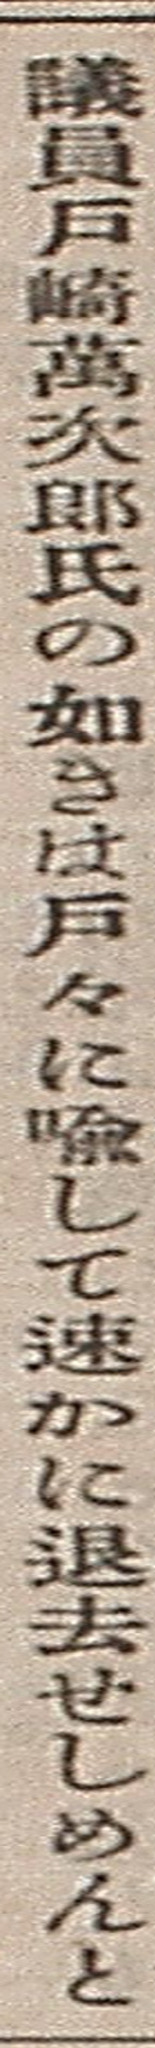議員戸崎萬次郎氏の如きは戸々に諭して速かに退去せしめんと
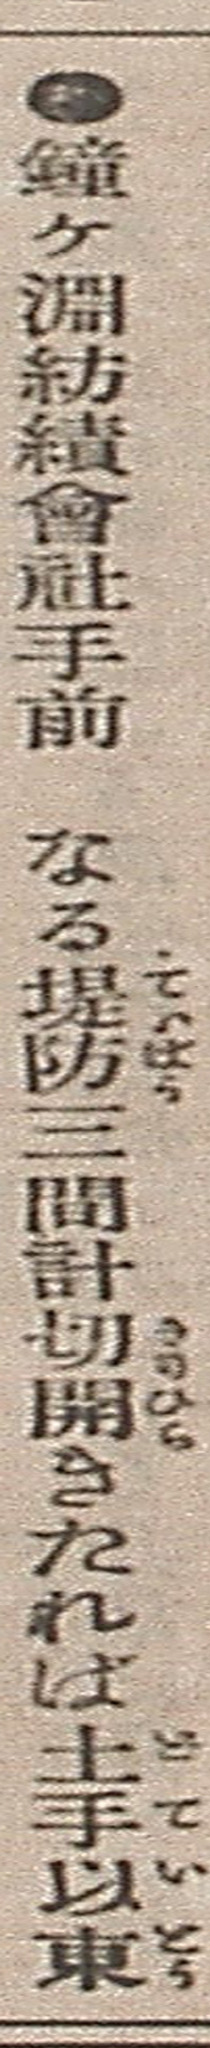●鐘ケ淵紡績会社手前なる堤防三間計切開きたれば土手以東
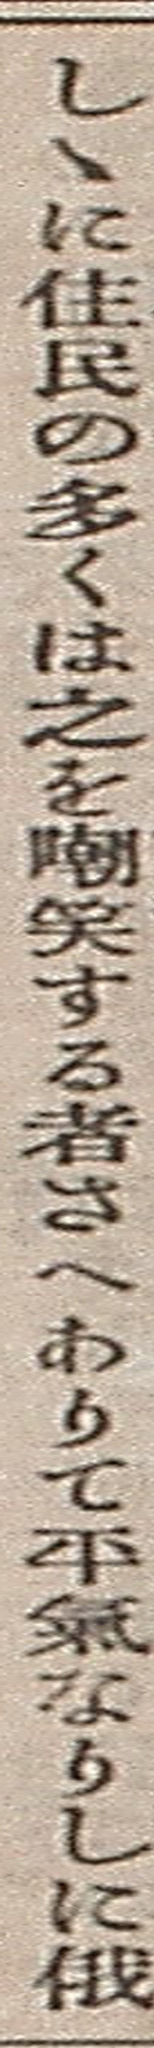しゝに住民の多くは之を嘲笑する者さへありて平気なりしに俄
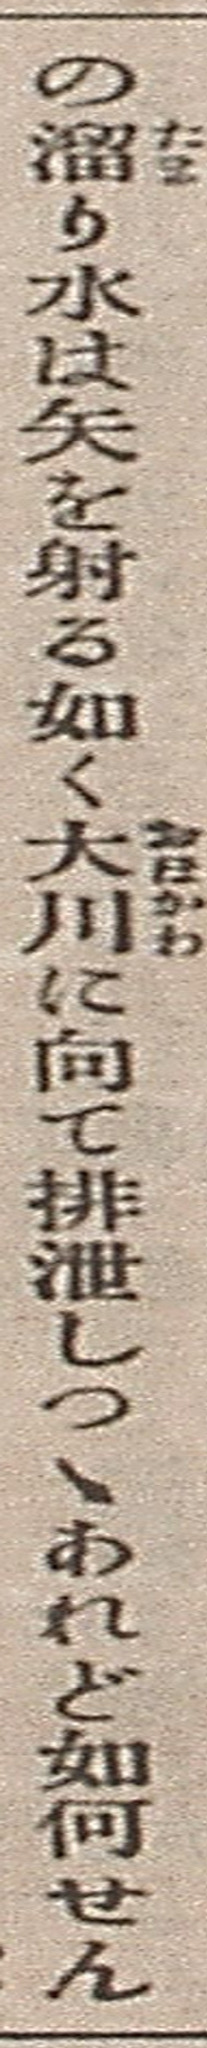の溜り水は矢を射る如く大川に向て排泄しつゝあれど如何せん
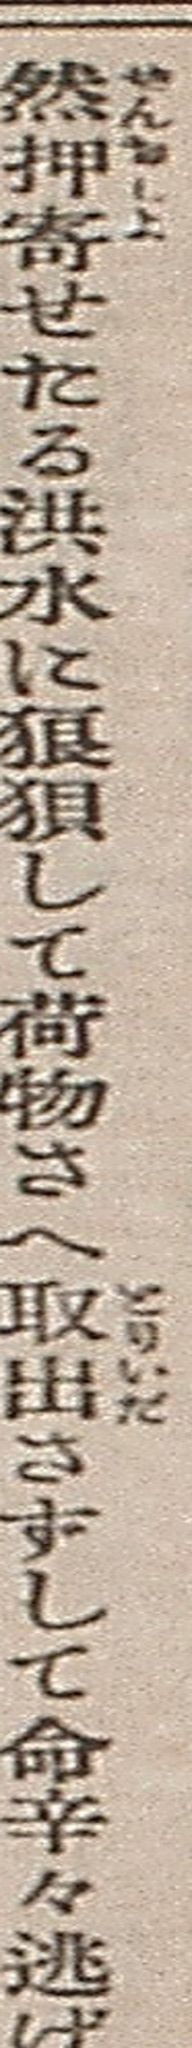然押寄せたる洪水に狼狽して荷物さへ取出さずして命辛々逃げ
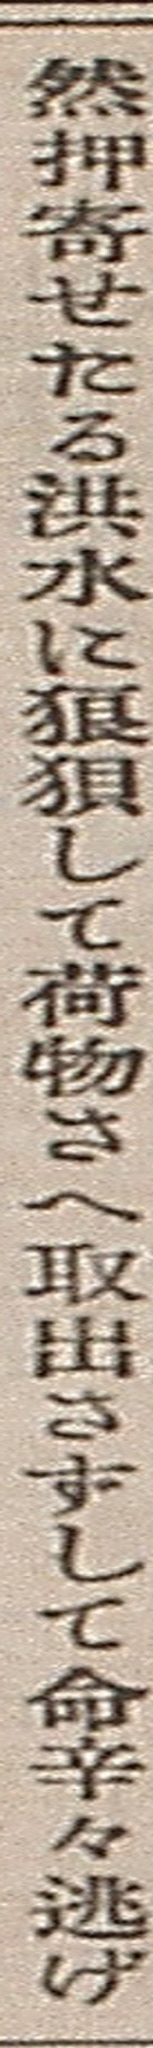然押寄せたる洪水に狼狽して荷物さへ取出さずして命辛々逃げ
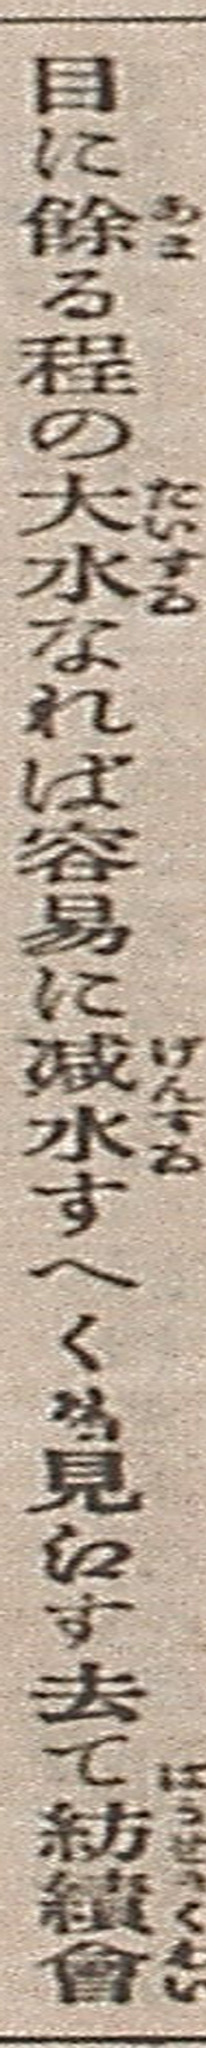目に余る程の大水なれば容易に減水すへくも見えす去て紡績会
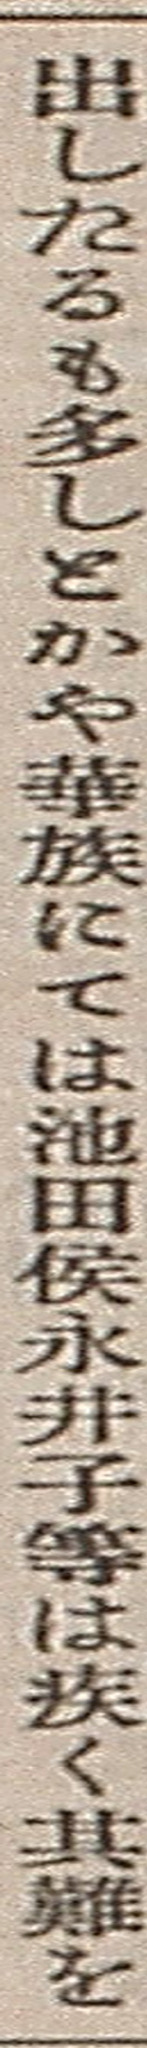出したるも多しとかや華族にては池田侯永井子等は疾く其難を
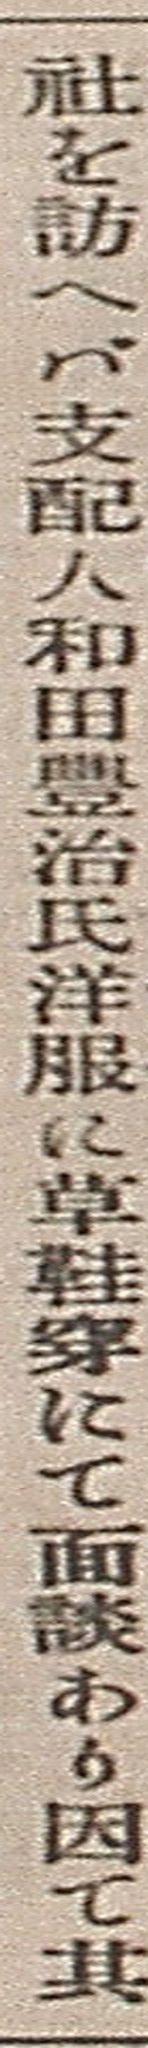社を訪へば支配人和田豊治氏洋服に草鞋穿にて面談あり因て其
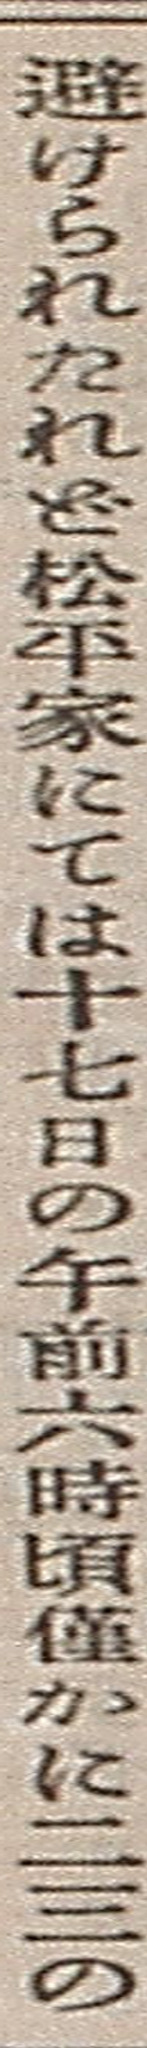避けられたれど松平家にては十七日の午前六時頃僅かに二三の
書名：風俗畫報臨時増刊第百二十四號　洪水地震被害録（上）
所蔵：東京大学地震研究所図書室 Earthquake Research Institute Library, The University of Tokyo, JAPAN
